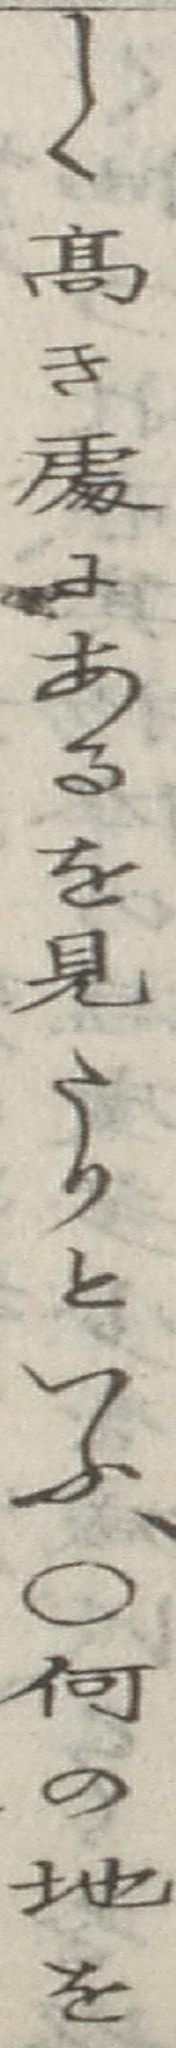しく高き処にあるを見たりといふ、〇何の地を
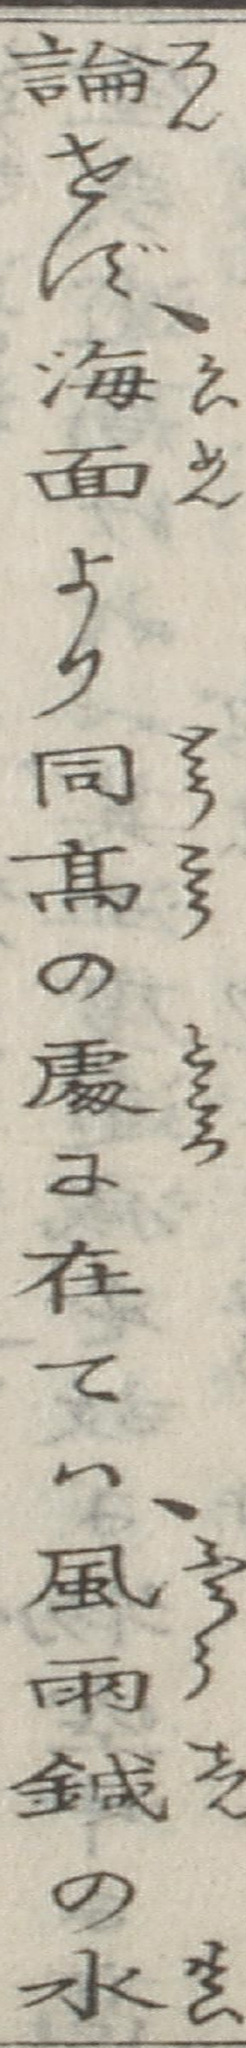論せず、海面より同高の処に在ては、風雨鍼の水
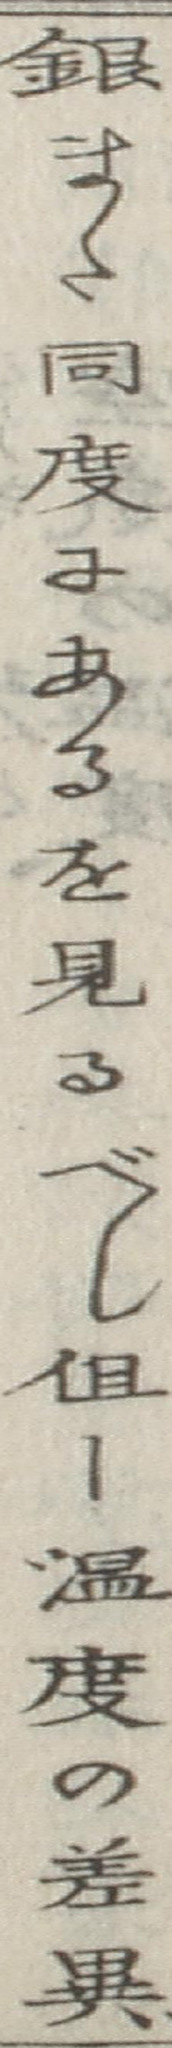銀また同度にあるを見るべし、但し温度の差異、
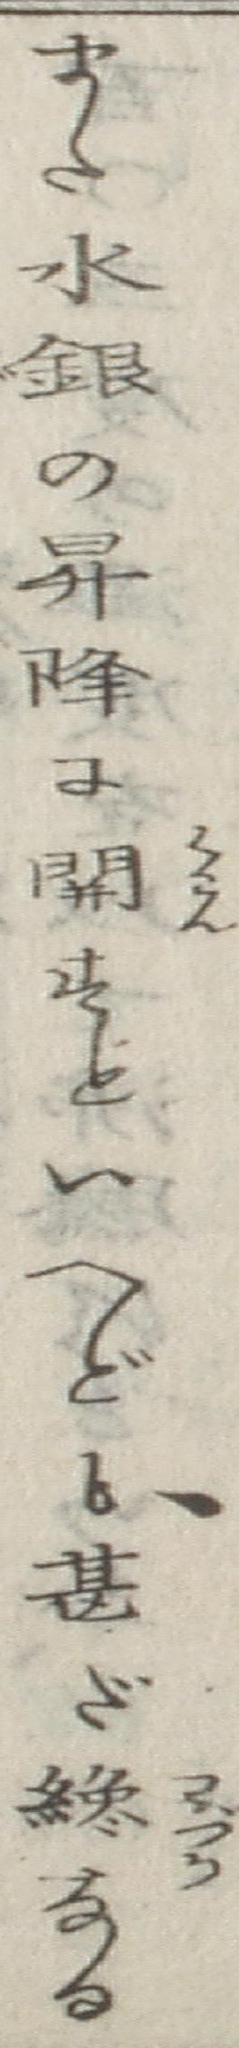また水銀の昇降に関すといへども、甚だ絻なる
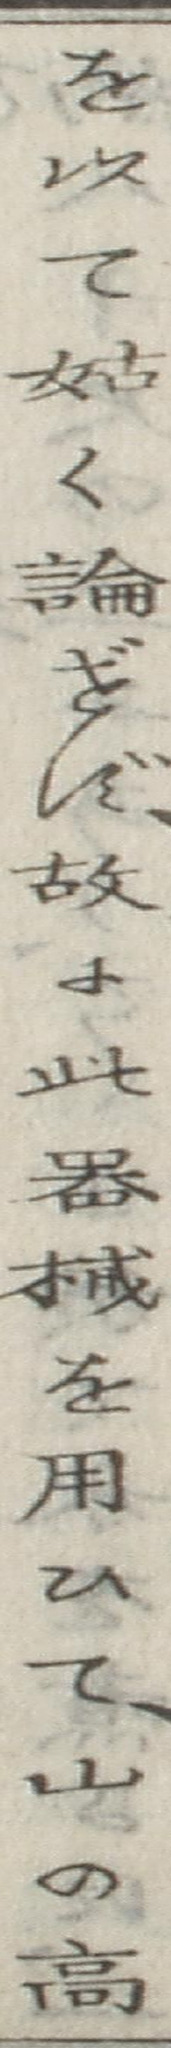を以て姑く論ぜず、故に此器械を用ひて、山の高
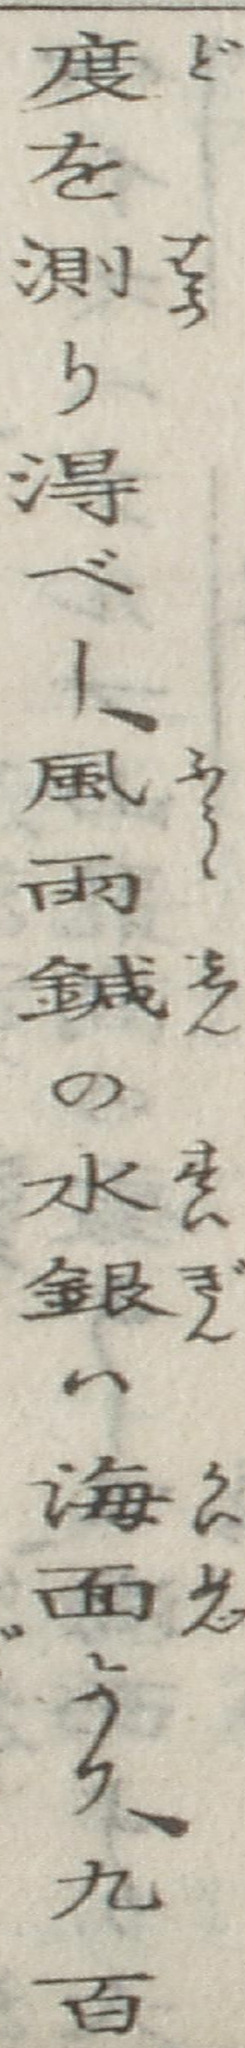度を測り得べし、風雨鍼の水銀は海面より、九百
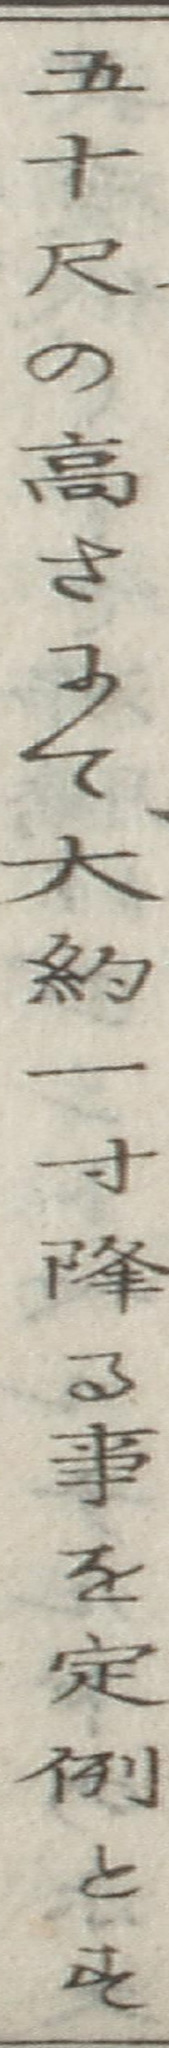五十尺の高さにて、大約一寸降る事を定例とす
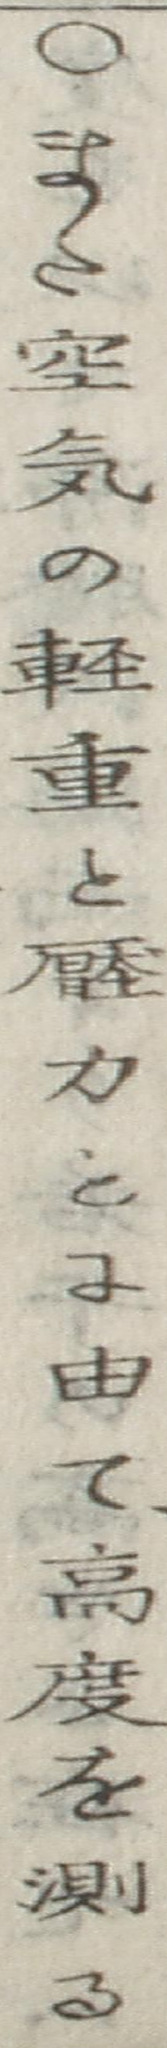〇また空気の軽重と圧力とに由て、高度を測る
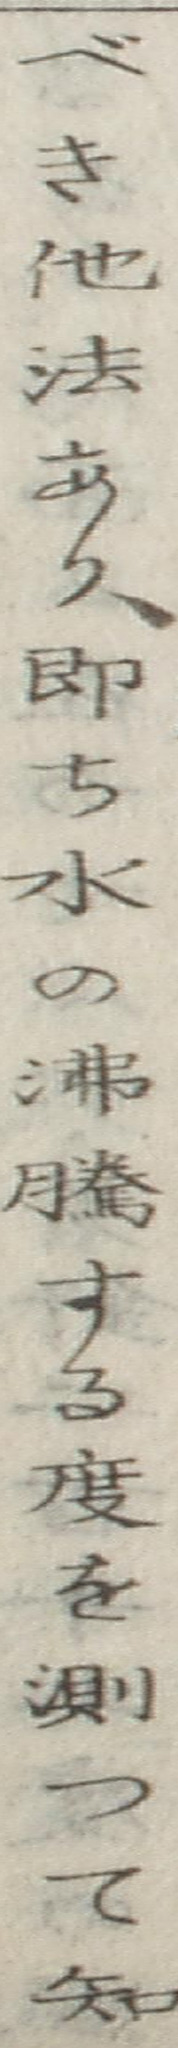べき他法あり、即ち水の沸騰する度を測つて知

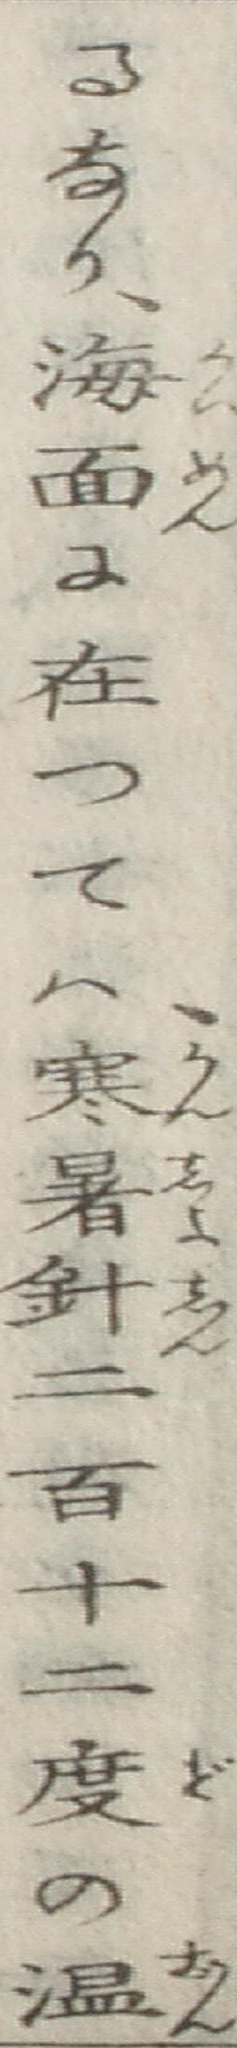るなり、海面に在つては、寒暑針二百十二度の温
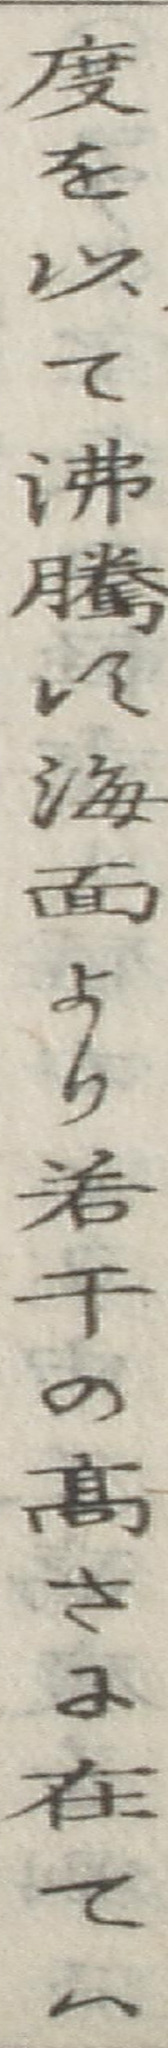度を以て沸騰す、海面より若干の高さに在ては、
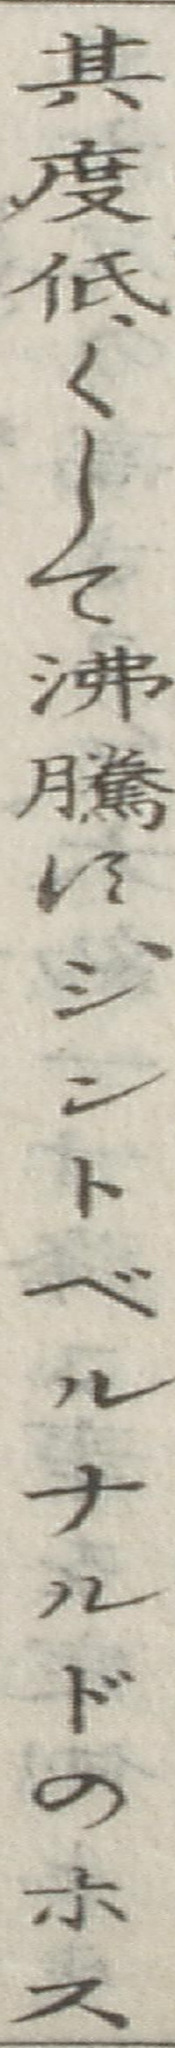其度低くして沸騰す、シントベルナルドのホス
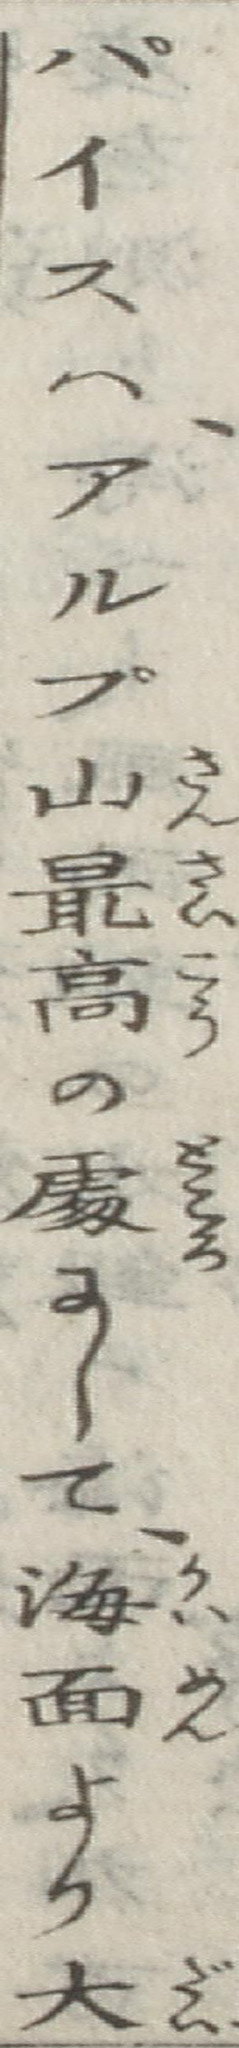パイスは、アルプ山最高の處にして、海面より大
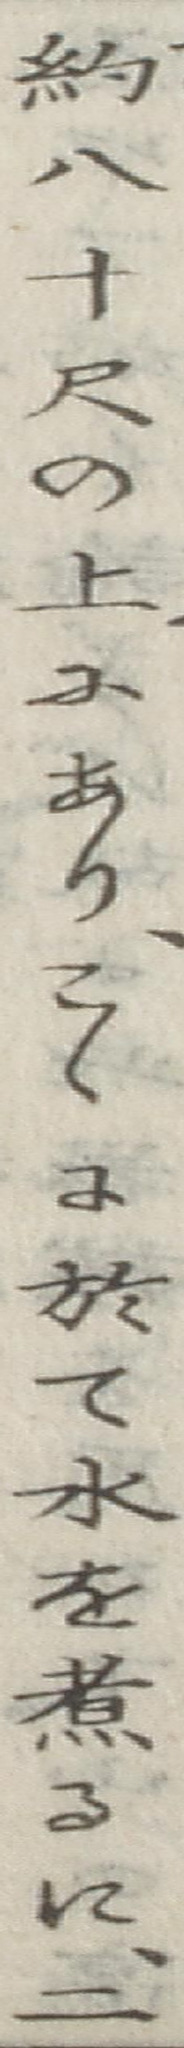約八十尺の上にあり、こゝに於て水を煮るに、二
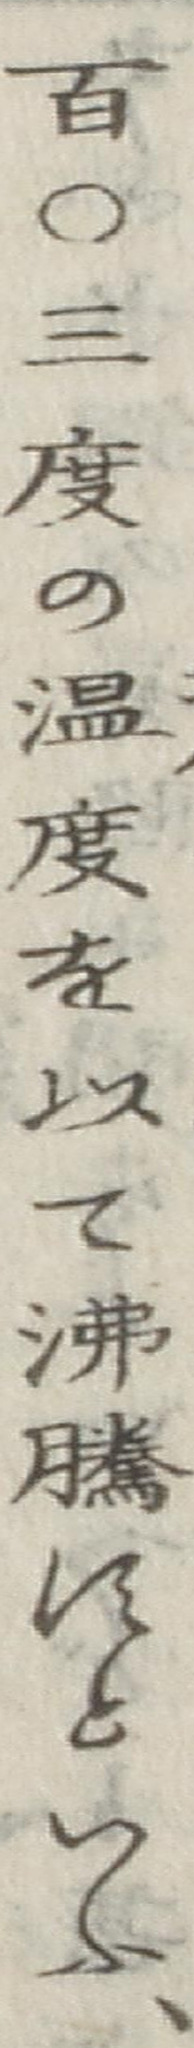百〇三度の温度を以て沸騰すといふ、
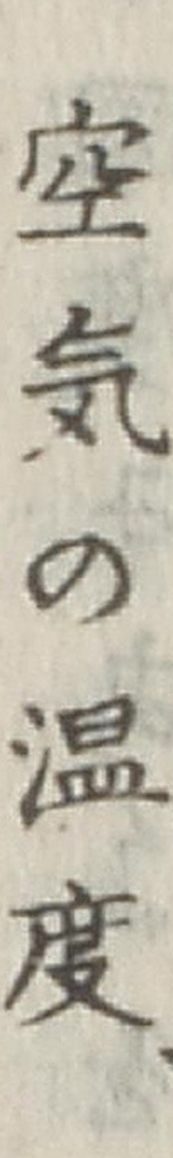空気の温度、
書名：訓蒙　天然地理學　中
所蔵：東京大学地震研究所図書室 Earthquake Research Institute Library, The University of Tokyo, JAPAN
